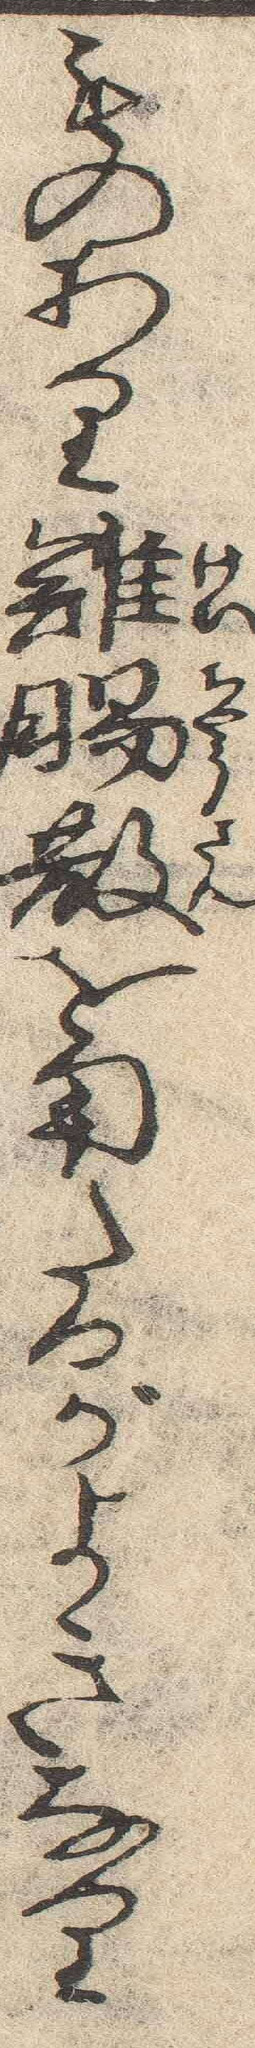ものあり雞腸散を用たるがよきなり
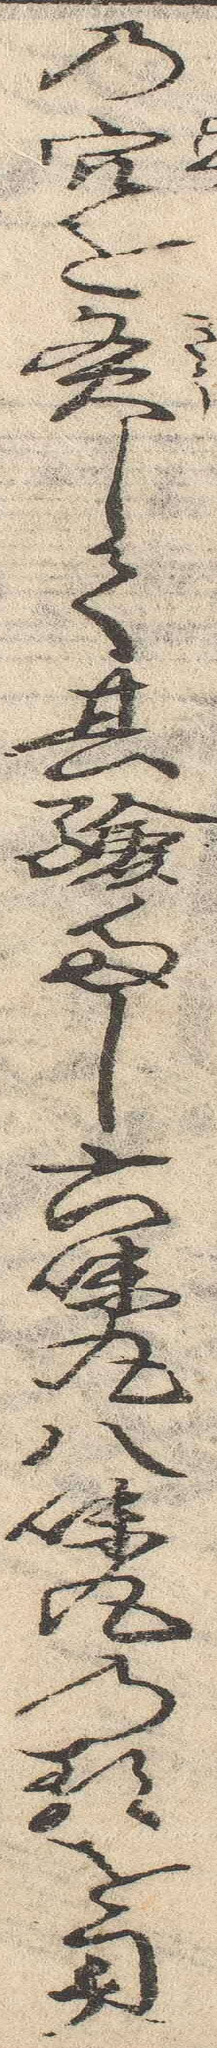の穴を灸して其験多し六味丸八味丸の類を用
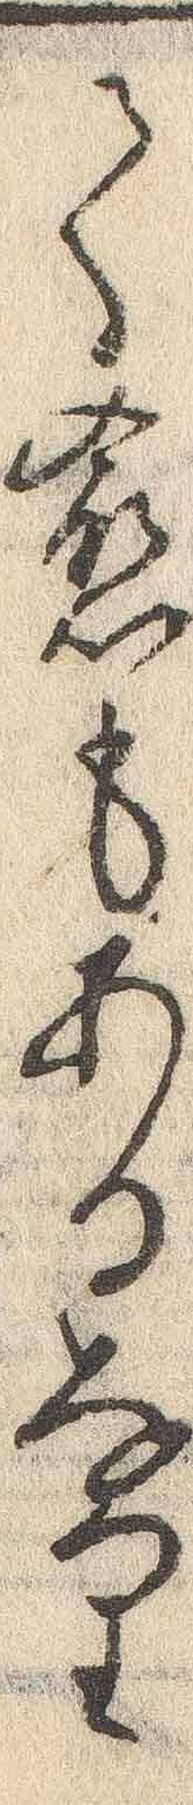て愈もあるなり
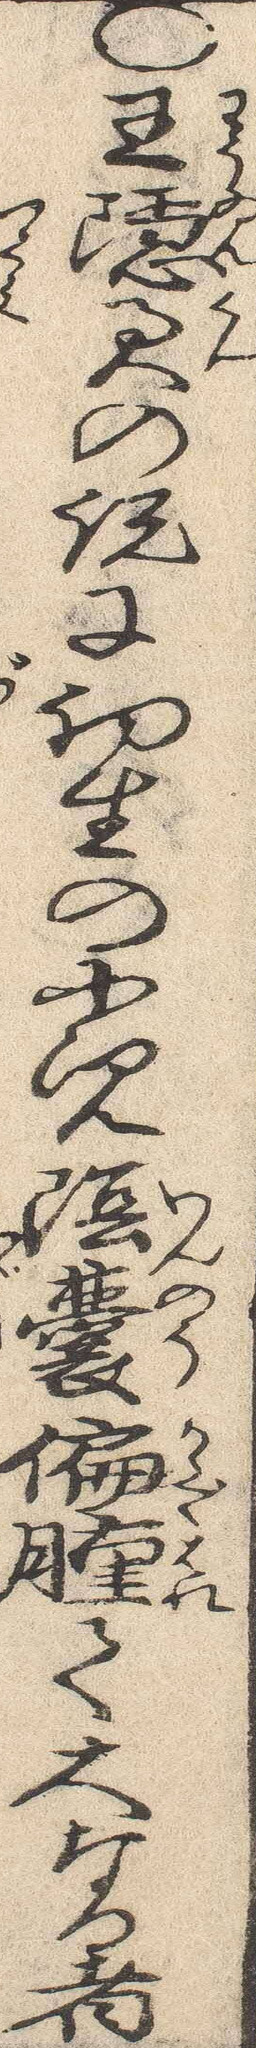○王隠君の説に初生の小児陰嚢偏腫て大なる者
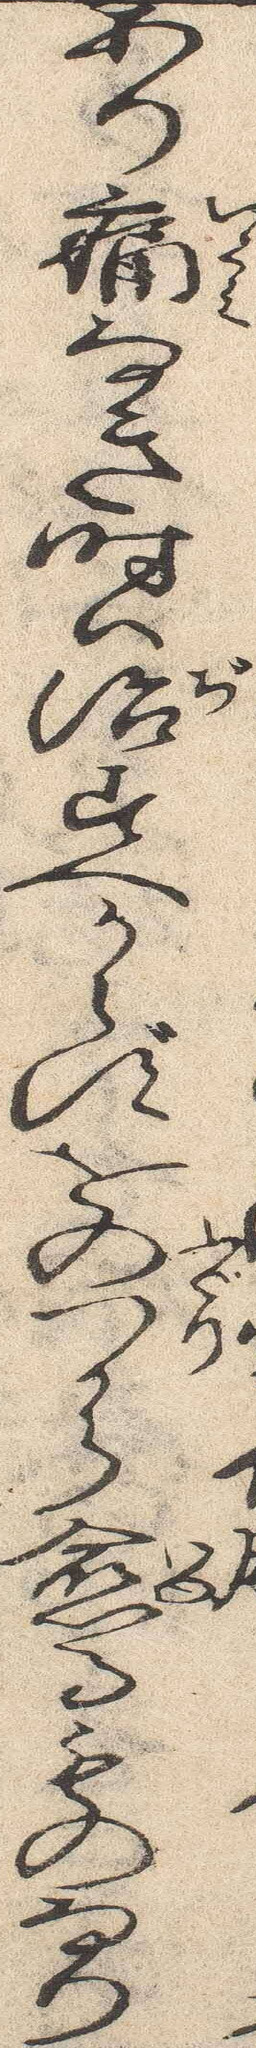あり痛なき時は治すへからずをのつから愈るものなり
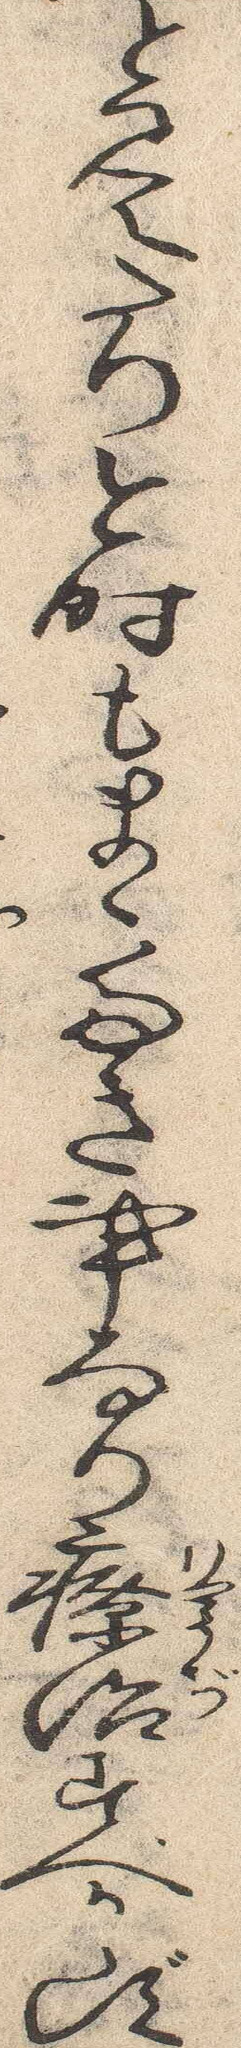と見えたり今時もまゝ多き事なり療治すべからず
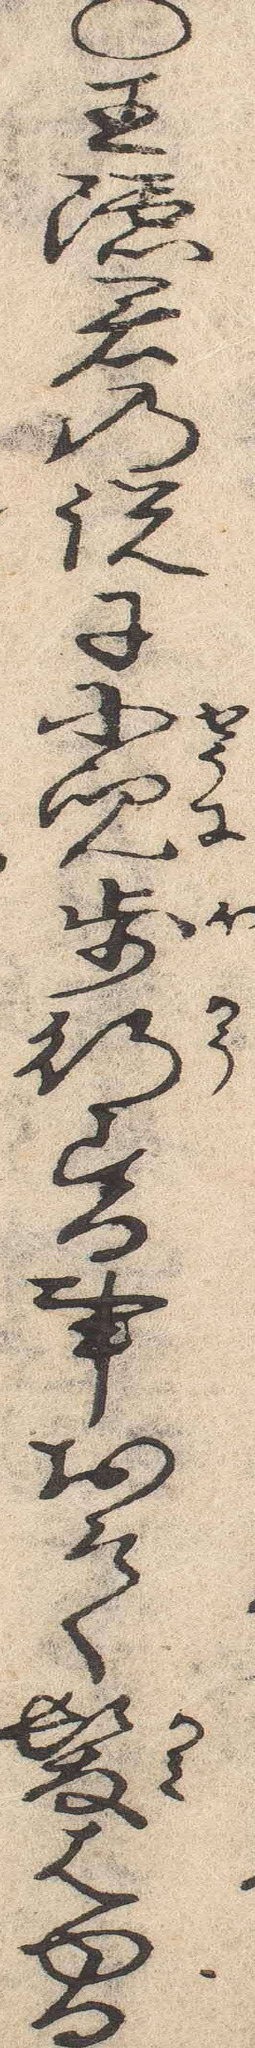○王隠君の説に小児歩行する事おそく髪はゆる
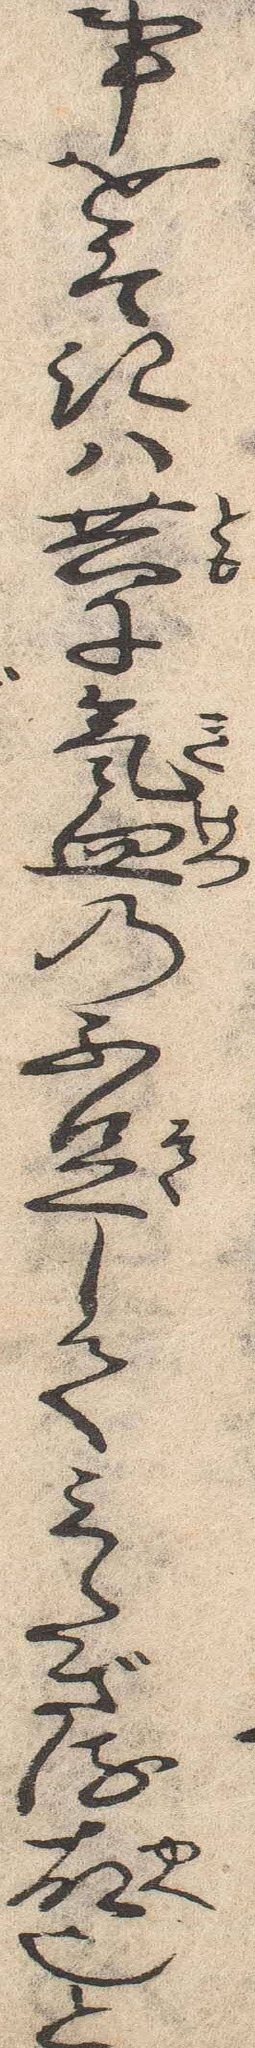事をそきは共に気血の不足してみたざる故也と
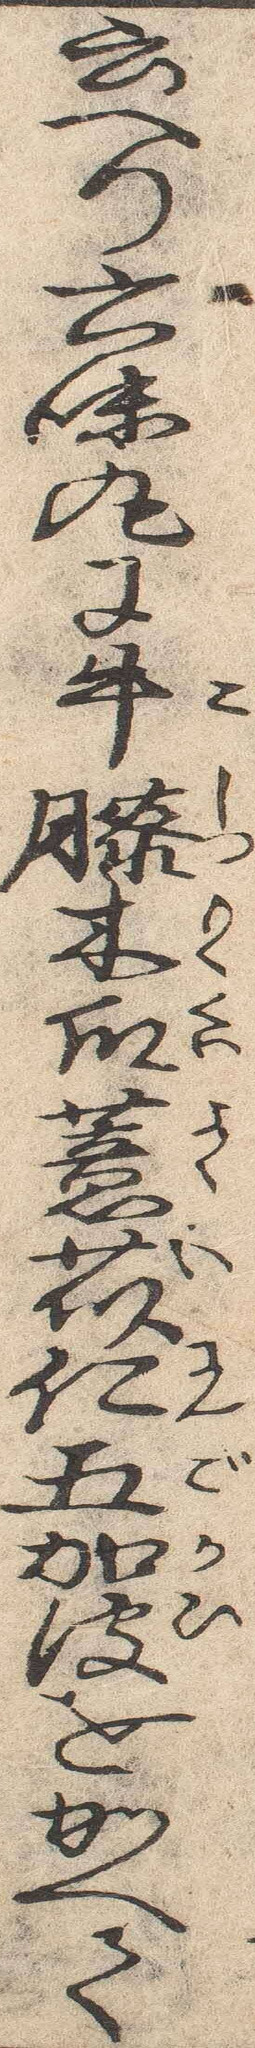云へり六味丸に牛膝木瓜薏苡仁五加皮を加へて
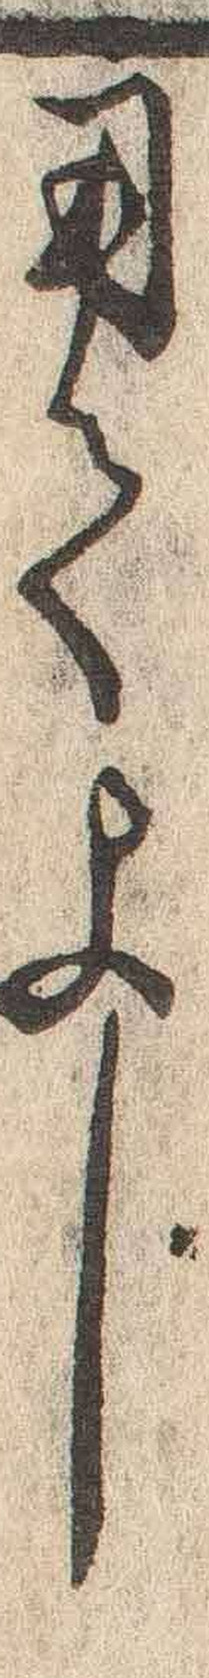用てよし
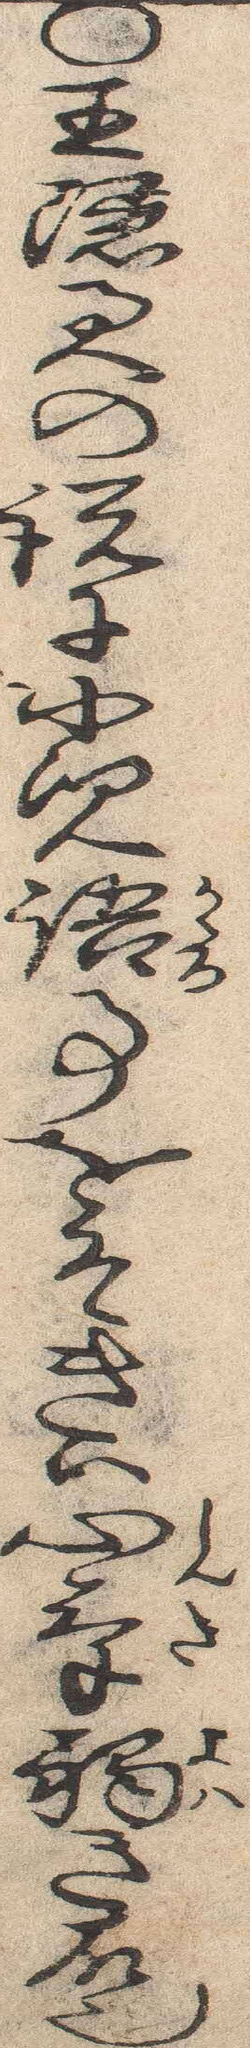○王隠君の説に小児語事をそきは心気弱き故也
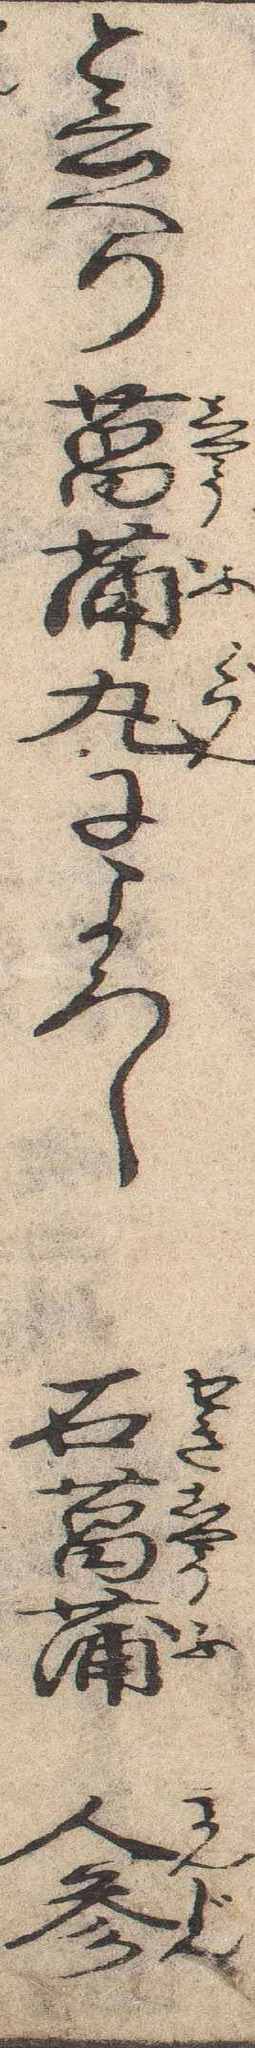と云へり菖蒲丸によろし石菖蒲人参
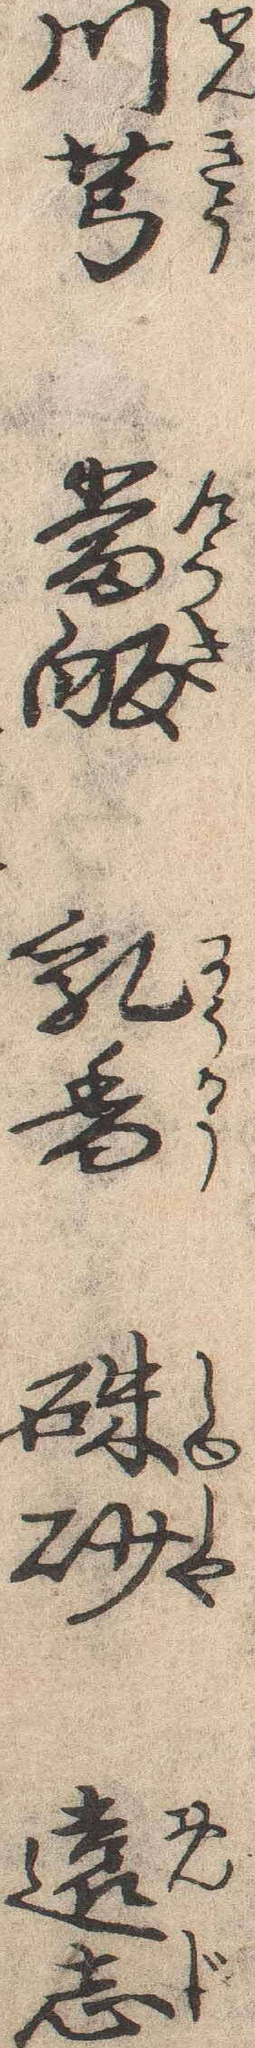川芎当皈乳香硃砂遠志
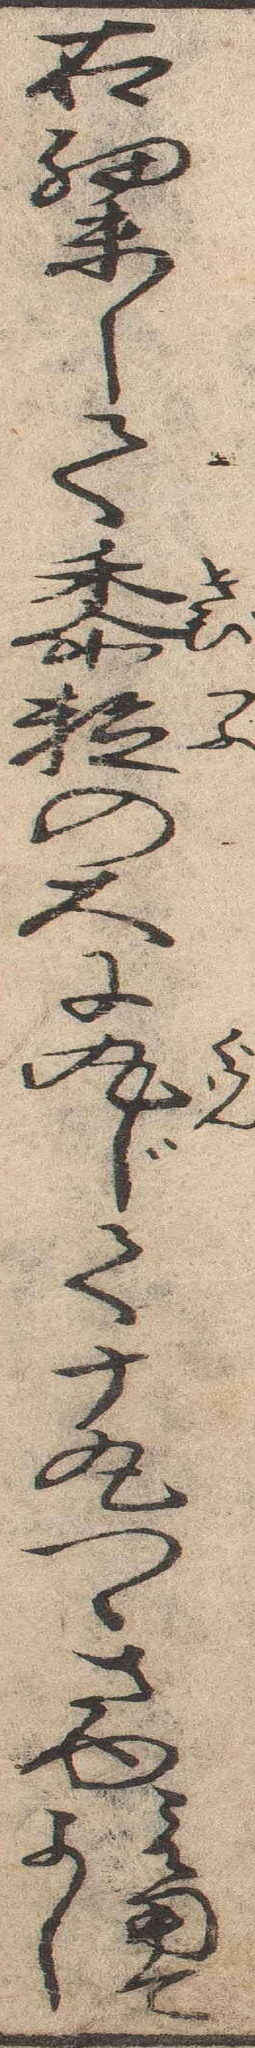右細末して黍粒の大に丸じて十丸つゝさゆにて用てよし

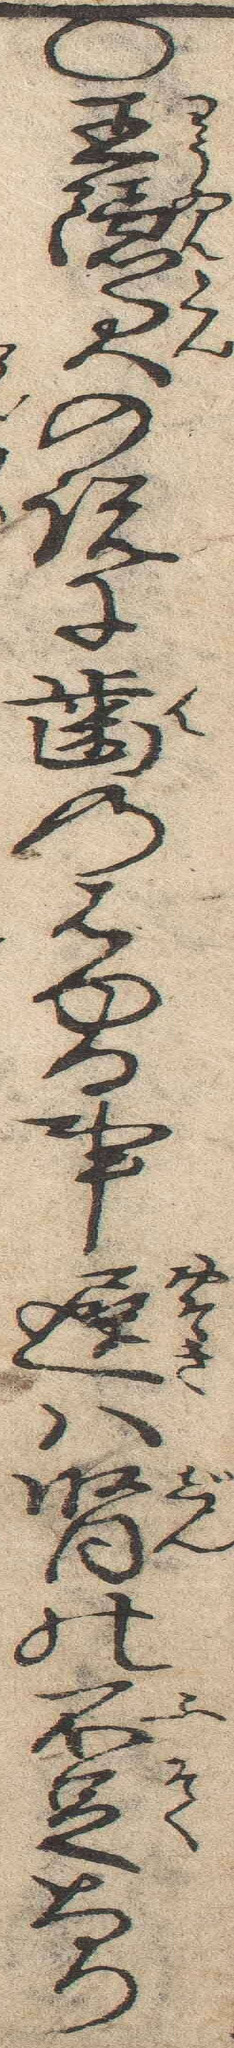王隠君の説に歯のはゆる事遅は腎の不足なり
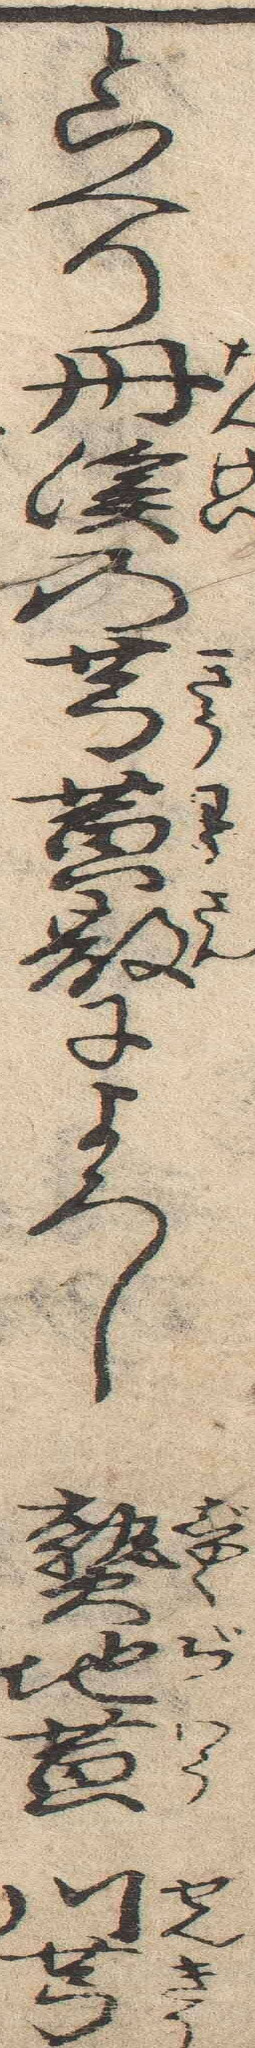といへり丹渓の芎黄散によろし熟地黄川芎
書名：小児必用養育草
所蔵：東京学芸大学附属図書館 国文学研究資料館
